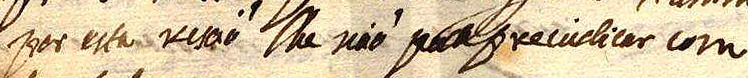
por esta resaõ lhe naõ pode preiudicar com
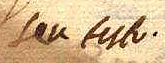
seu testo.
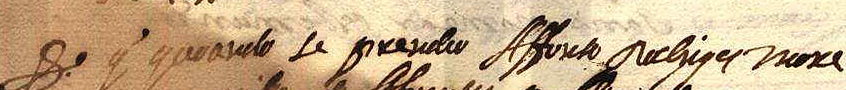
Ꝓ q̄ quando se prendeo Affonso Rodriges more
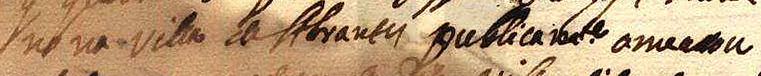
no na villa de Abrantes publicam.te ameassou
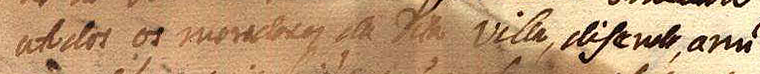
a todos os moradores da dita Villa, disendo, a mī
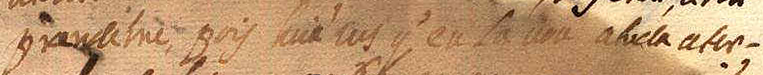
prendēme, pois huā ues q̄ eu la uou a toda a ter
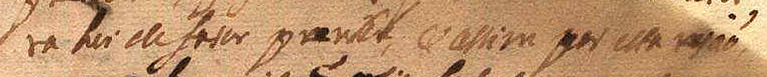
ra hei de faser prender, e assim por esta resão
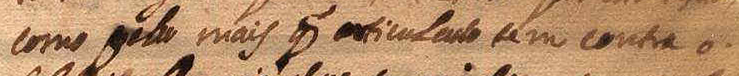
como pello mais q̄ articulado tem contra o
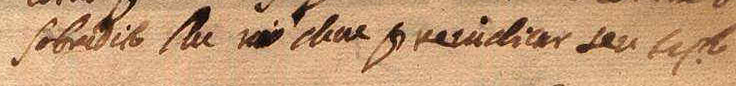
sobredito lhe nō deue preiudicar seu tes.to
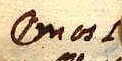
Em os 1
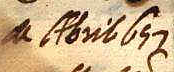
de Abril 657
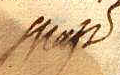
Mages
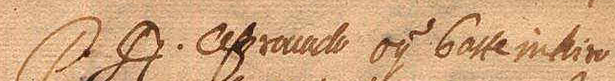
P R. e prouado o q̄ baste inteiro
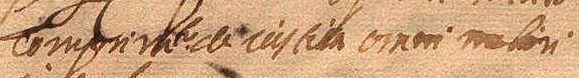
comprim.to de iustiça omni meliori
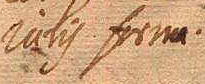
iuris forma.
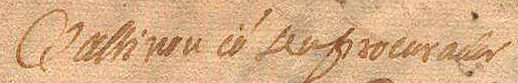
E assinou cō seu procurador
